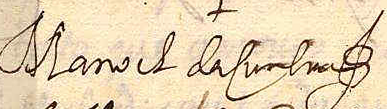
Manoel da Cunha
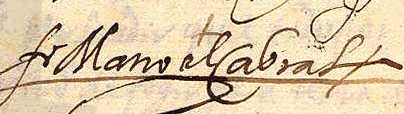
fr Manoel Cabral
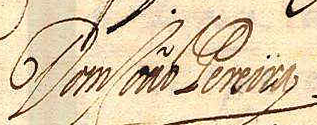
Dom João Pereira
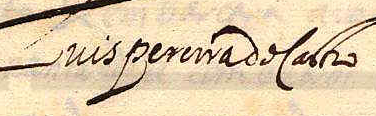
Luis pereira do Castro
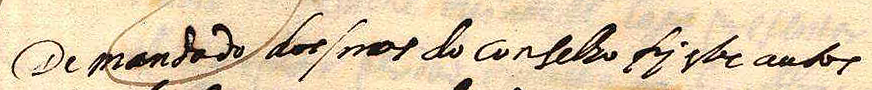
De mandado dos snres do conselho fiz estes autos
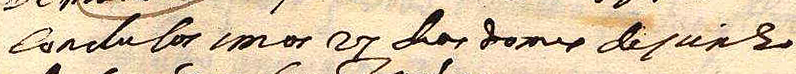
conclusos em os 27 dias do mes de junho
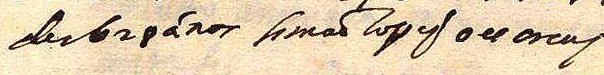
de 1628 ānos simaõ lopez o escreuj
